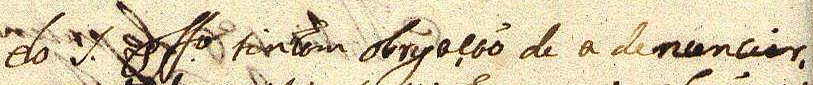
do S. Off.o tinham obrigaçaõ de a denunciar,
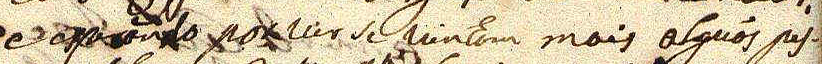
e esperando por uer se uinham mais alguās pes
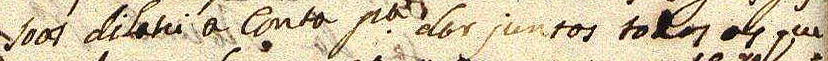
soas dilatei a Conta p.a dar juntos todas as que
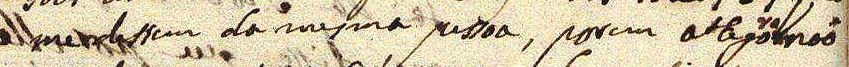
me dessem da mesma pessoa, porem athe go naõ
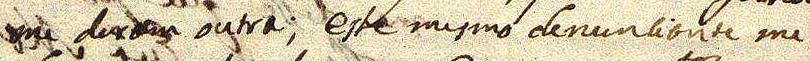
me deram outra; este mesmo denunciante me
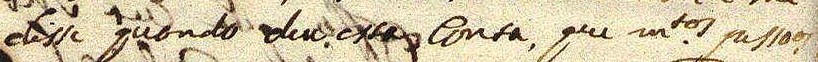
disse quando deu esta Conta, que m.tas pessoas
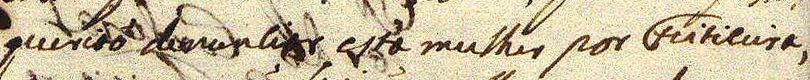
queriaõ denunçiar esta mulher por Feiticeira,
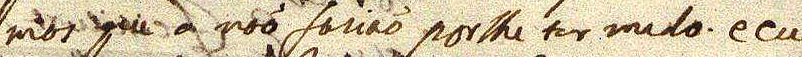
mas que a naõ faziaõ por lhe ter medo. e cu
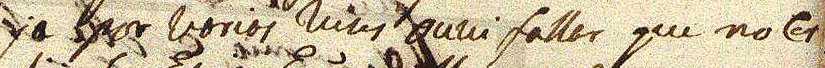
ja por varias uezes ouui fallar que no Cer
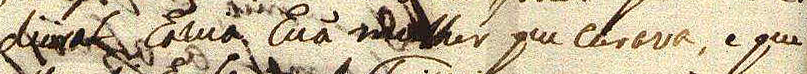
deiral hauia huā mulher que curava, e que
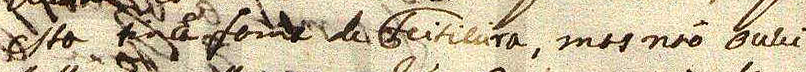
esta tinha fama de Feiticeira, mas naõ ouui
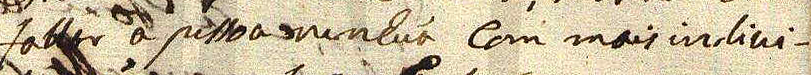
fallar a pessoa nenhuā com mais indiui
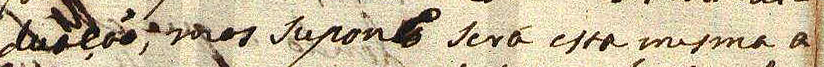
duação, mas suponho será esta mesma a
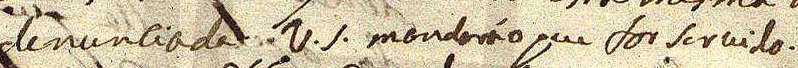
denunciada. v. s. mandarão que for seruido.
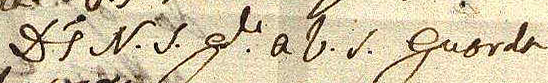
Ds̄ N. s. g.e a v. s. Guarda
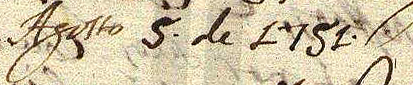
Agosto 5. de 1751. //
